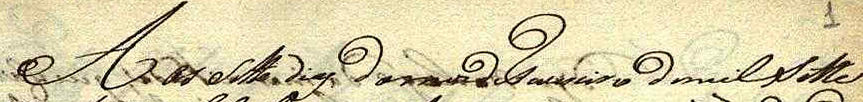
Aos sette dias do mez de Feuereiro de mil Sette
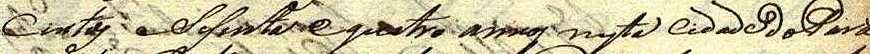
centos e Sesenta e quatro annos nesta cidade do Para
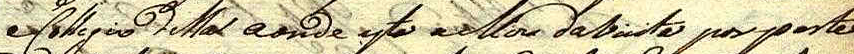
e Collegio della aonde esta a Meza da visita por parte
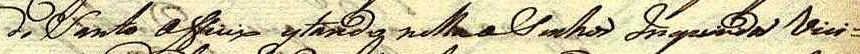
do Santo officio estando nella o Senhor Inquizidor Vizi
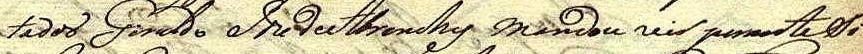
tador Giraldo Joze de Abranches mandou vir perante Si
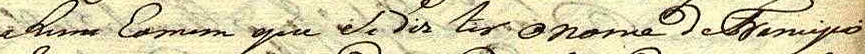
a hum homem que se diz ter o nome de Francisco
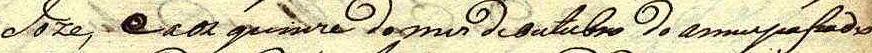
Joze, e aos quinze do mes de outubro do anno passado
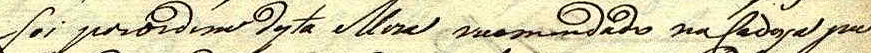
foi por ordem desta Meza recomendado na Cadeya pu
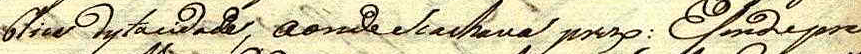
blica desta cidade, aonde Se achaua prezo: E sendo pre
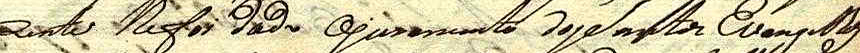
zente lhe foi dado o juramento dos Santos Evangelhos
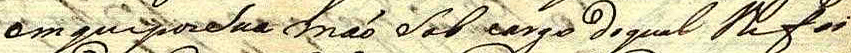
em que poz Sua maõ Sob cargo do qual lhe foi
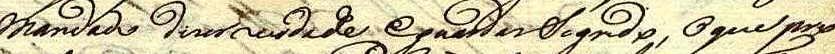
mandado dizer verdade e guardar Segredo, O que pro
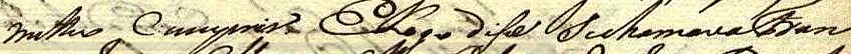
metteo cumprir E Logo disse Se chamava Fran
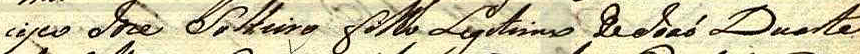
cisco Joze Solteiro filho Legitimo de Joaõ Duarte
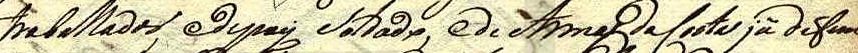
trabalhador, e depois soldado, e de Anna da Costa já defun
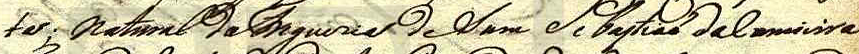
ta; natural da Freguezia de Sam Sebastiaõ da Comieira
